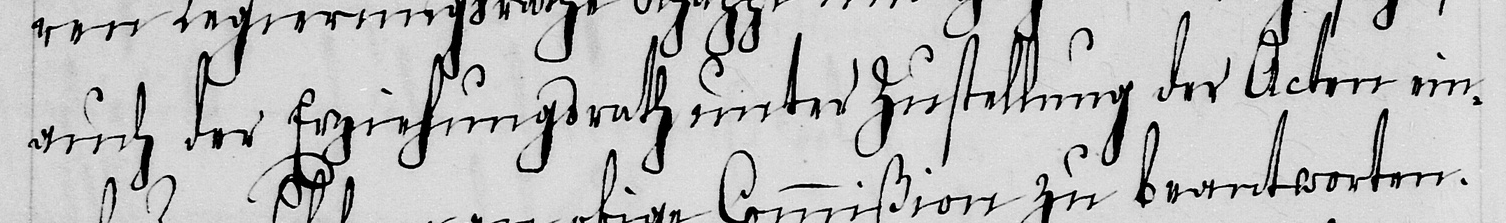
auch der Erziehungsrath unter Zustellung der Acten ein¬
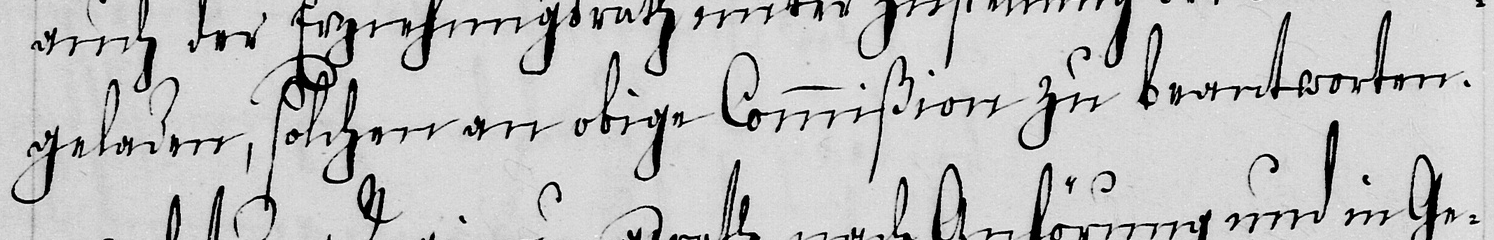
geladen, solchen an obige Commißion zu beantworten.
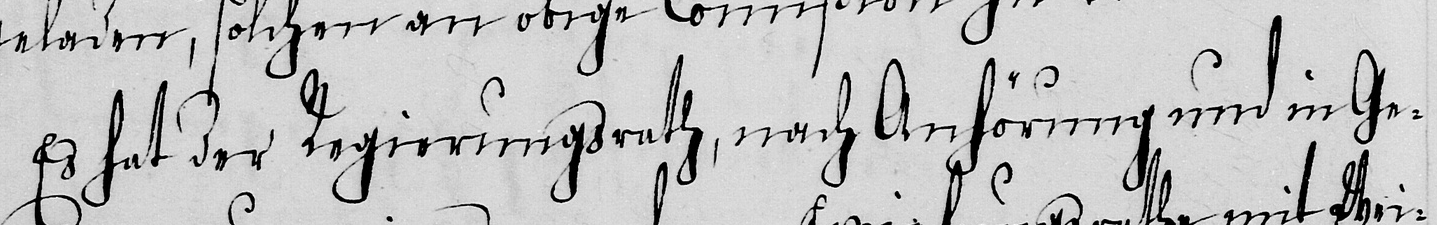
Es hat der Regierungsrath, nach Anhörung und in Ge¬
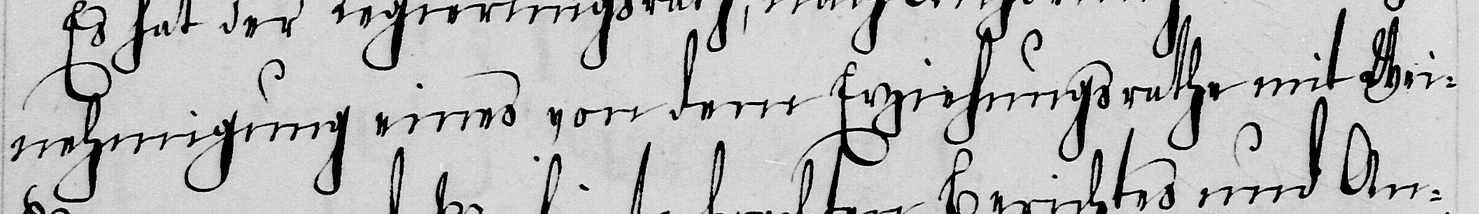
nehmigung eines von dem Erziehungsrathe mit Wei¬
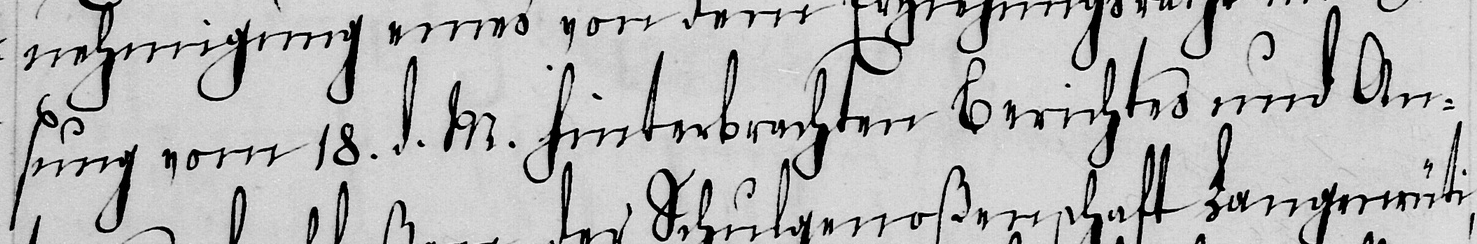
sung vom 18. d. M. hinterbrachten Berichtes und An¬
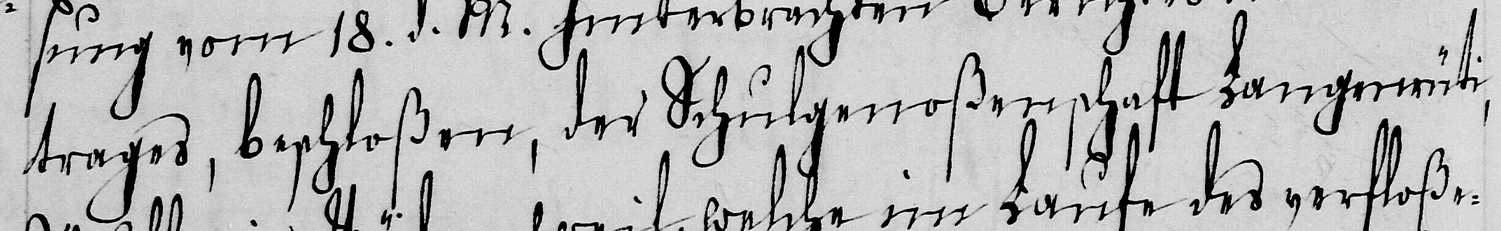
trages, beschloßen, der Schulgenoßenschaft Langenrüti,
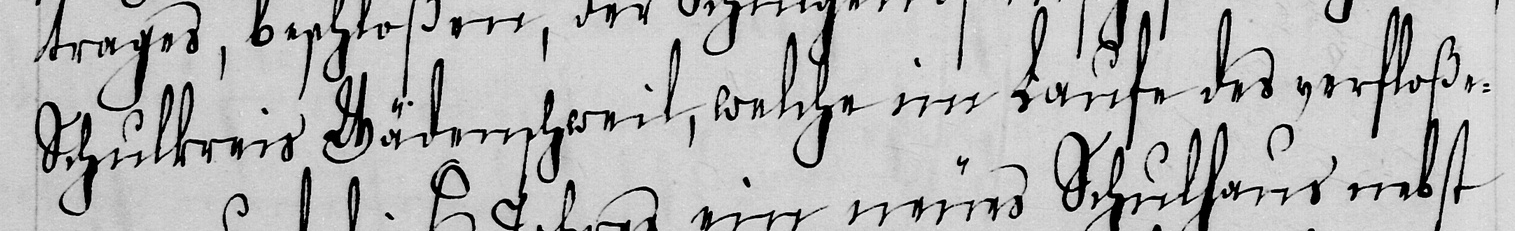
Schulkreis Wädenschweil, welche im Laufe des verfloße¬
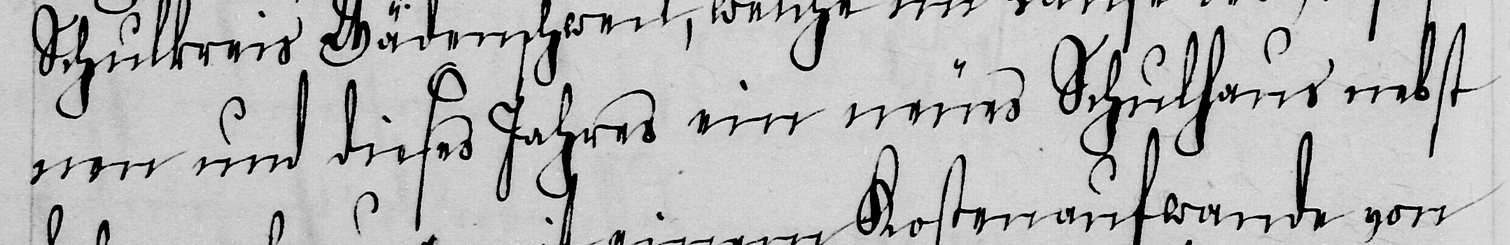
nen und dieses Jahres ein neues Schulhaus nebst
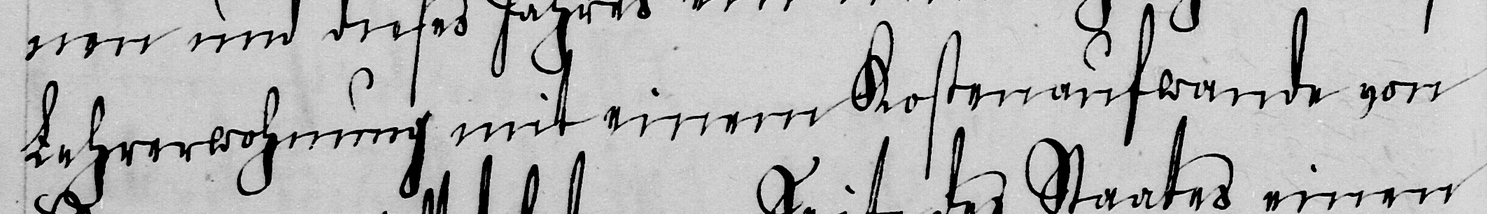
Lehrerwohnung mit einem Kostenaufwande von
